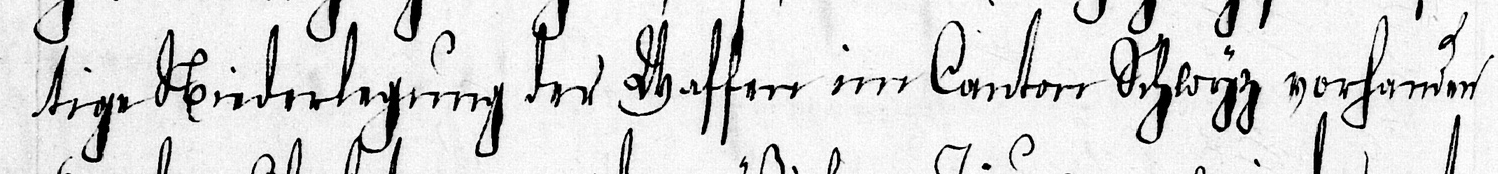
itige Niederlegung der Waffen im Canton Schwyz vorhanden
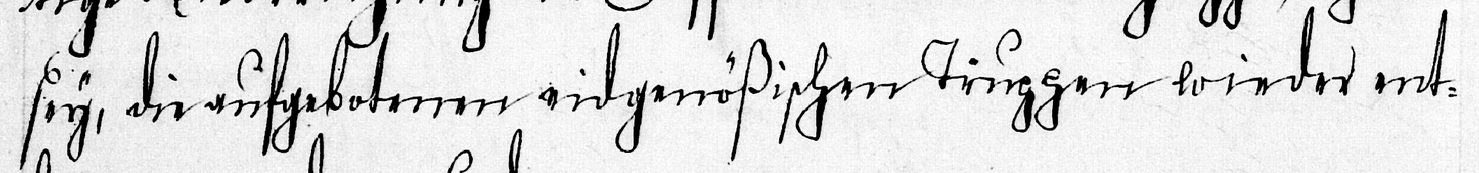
sey, die aufgebotenen eidgenößischen Truppen wieder ent¬
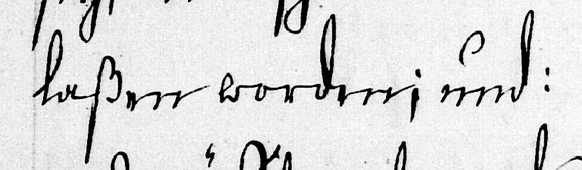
laßen worden; und:
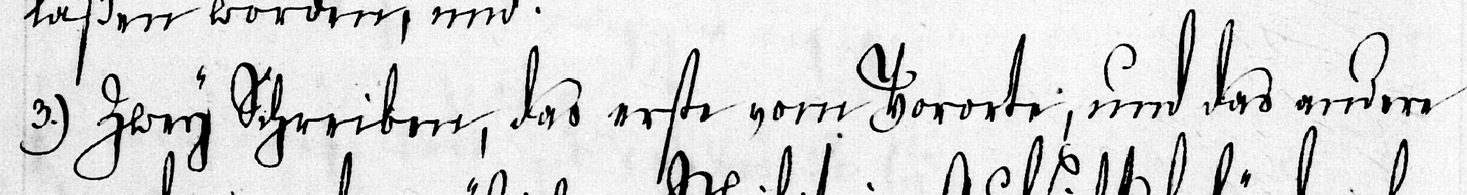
3.) Zwey Schreiben, das erste vom Vororte, und das andere
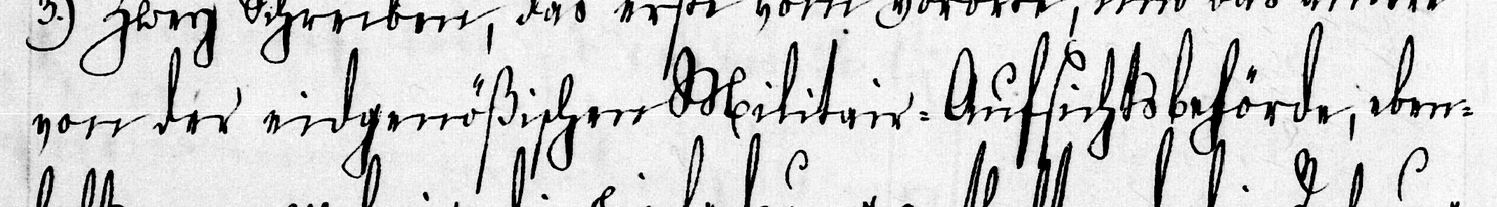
von der eidgenößischen Militair-Aufsichtsbehörde, eben¬
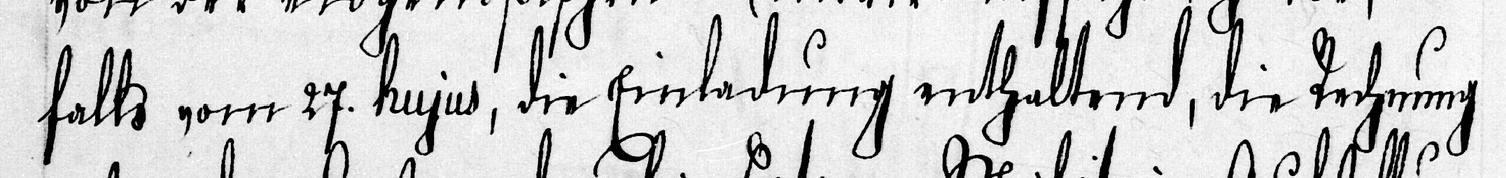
falls vom 27. hujus, die Einladung enthaltend, die Rechnung
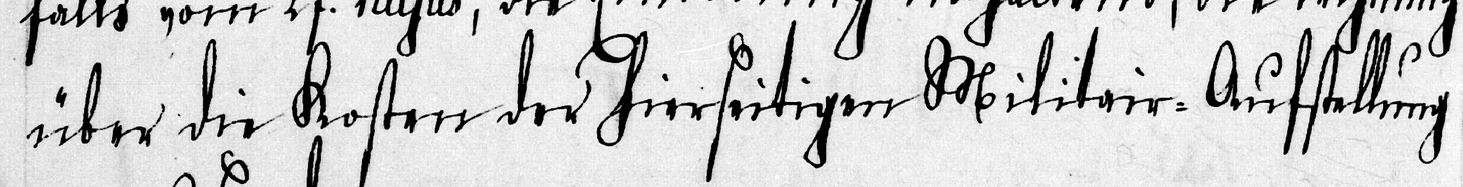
über die Kosten der hierseitigen Militair-Aufstellung
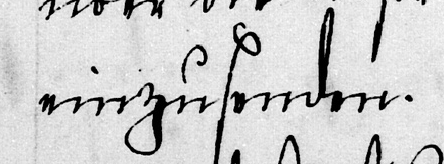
einzusenden.
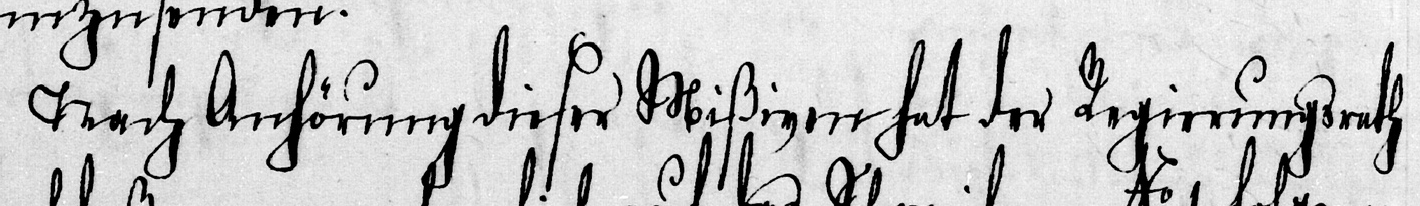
Nach Anhörung dieser Mißiven hat der Regierungsrath
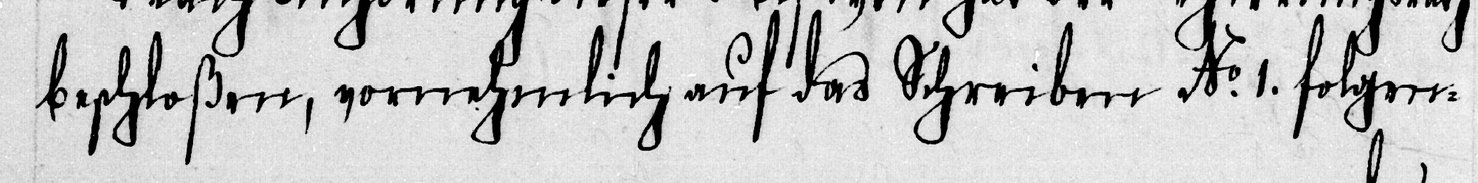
beschloßen, vornehmlich auf das Schreiben No. 1. folgen-
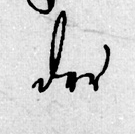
den
